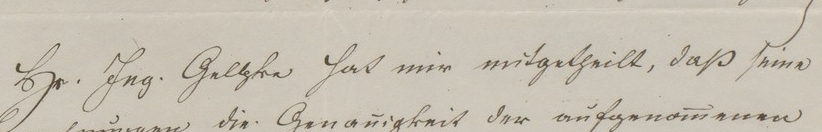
Hr. Ing. Gelpke hat mir mitgetheilt, daß seine
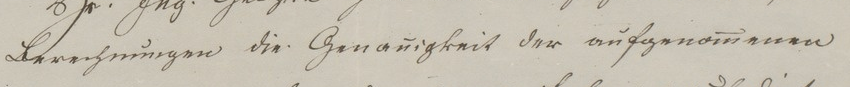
Berechnungen die Genauigkeit der aufgenommenen
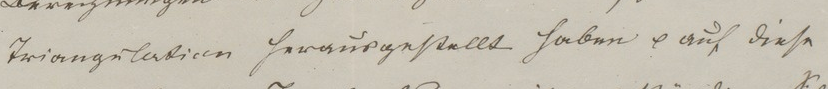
Triangulation herausgestellt haben & auf diese
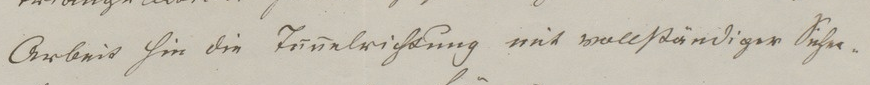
Arbeit hin die Tunnelrichtung mit vollständiger Sicher-
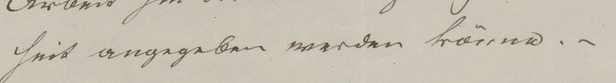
heit angegeben werden könne. –
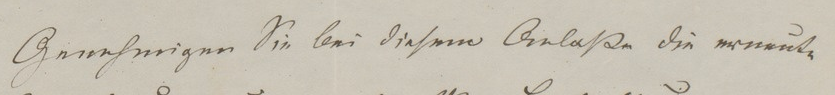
Genehmigen Sie bei diesem Anlaße die erneute
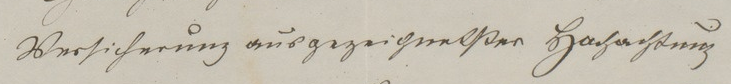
Versicherung ausgezeichnetster Hochachtung
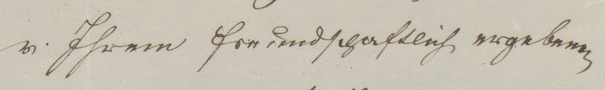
v. Ihrem freundschaftlich ergebenen
